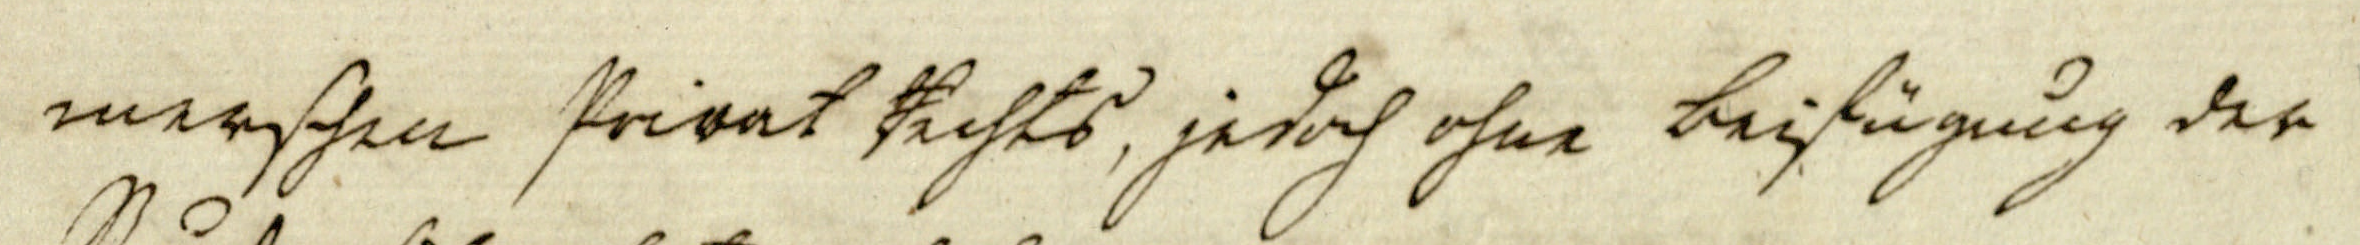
merschen Privat Rechts, jedoch ohne Beifügung der
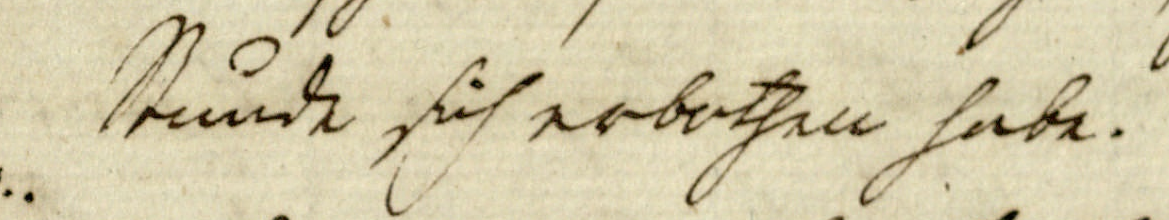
Stunde sich erbothen habe.
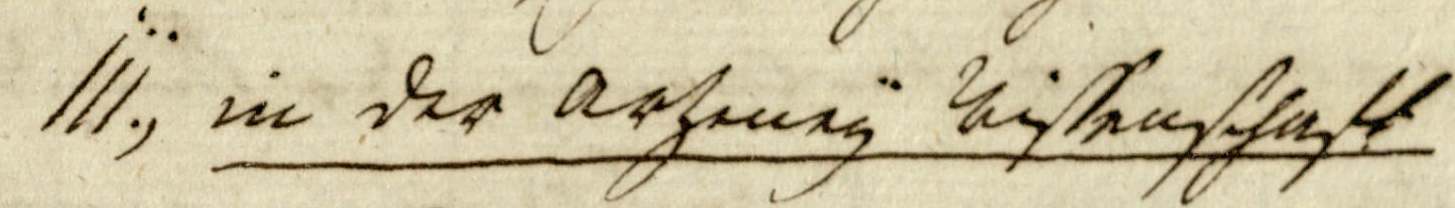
III., in der Arzeneÿ Wissenschaft
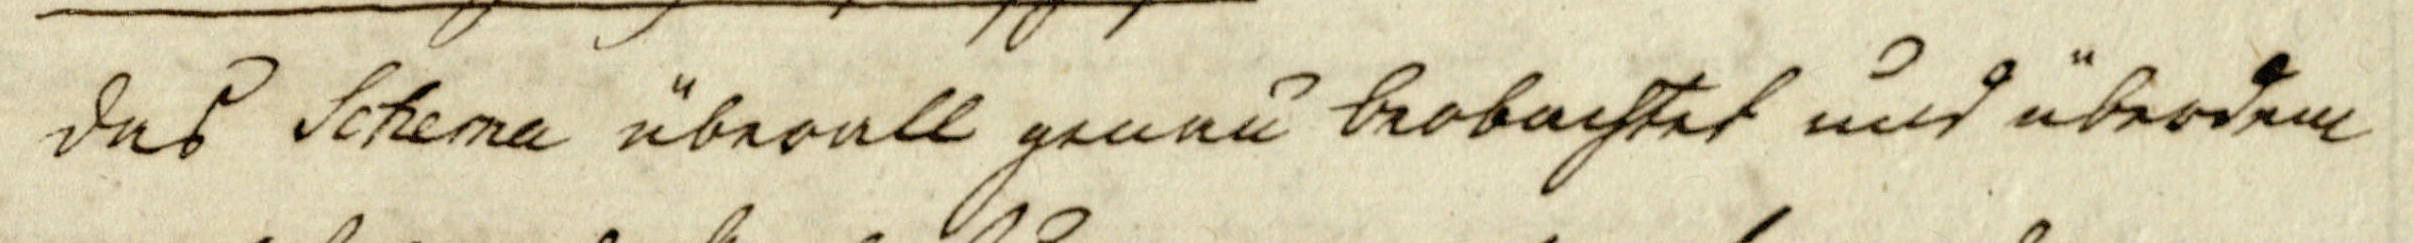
das Schema überall genau beobachtet und überdem
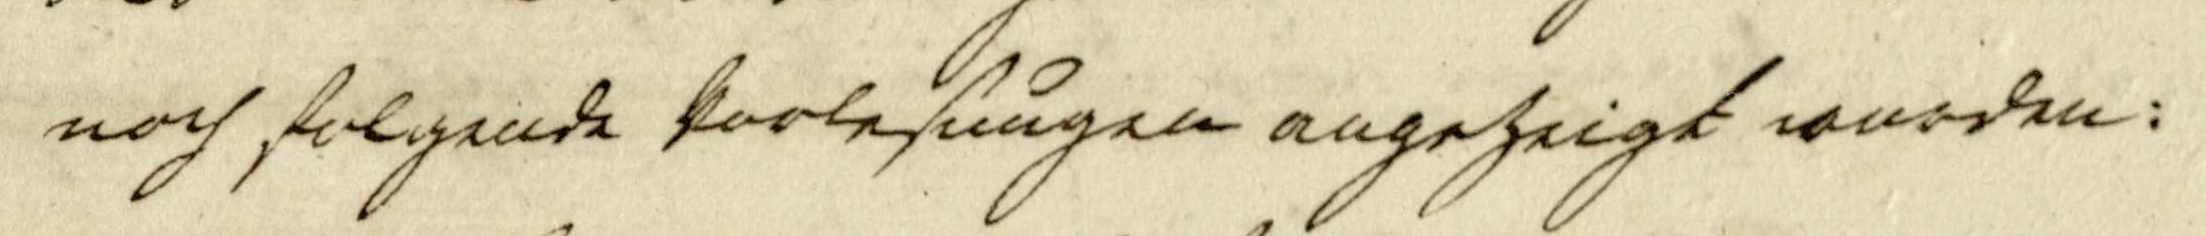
noch folgende Vorlesungen angezeigt wurden:
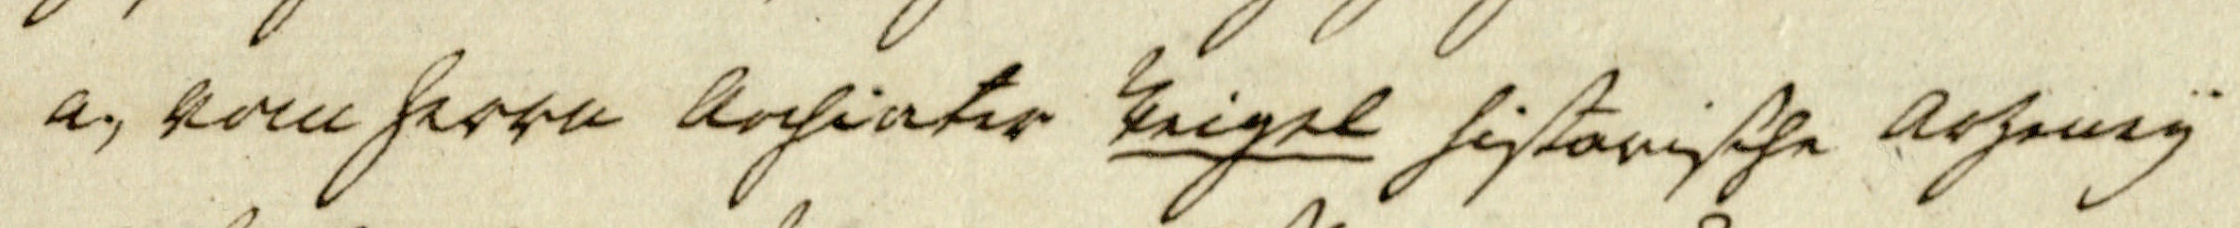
a., vom herrn Archiater Weigel historische Arzeneÿ
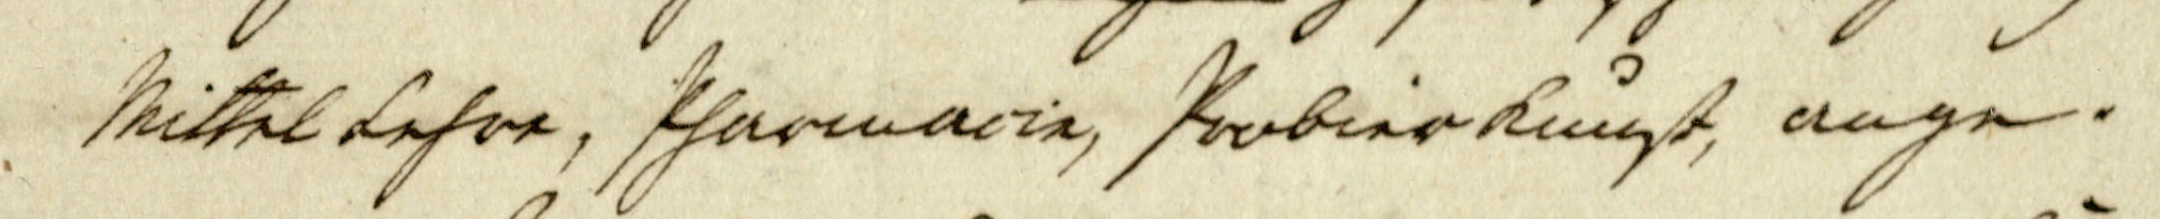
Mittel Lehre, Pharmacie, Probierkunst, ange¬
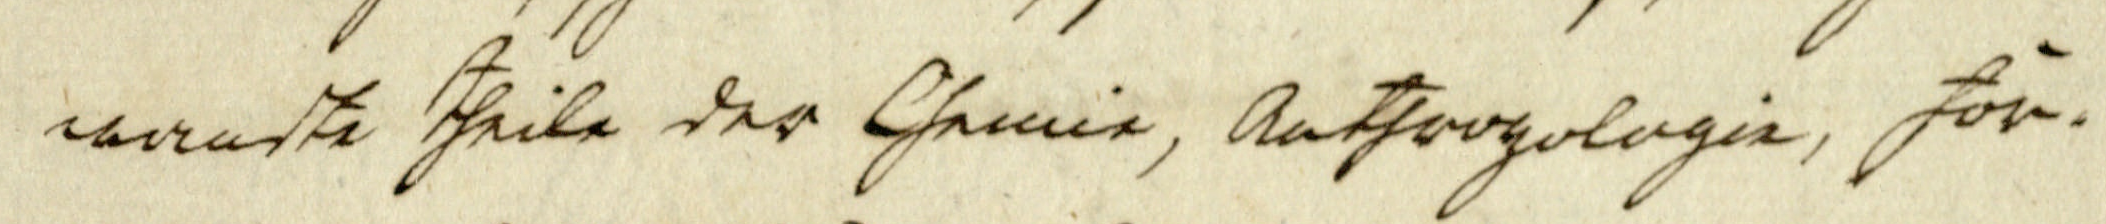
wandte Theile der Chemie, Anthropologie, For¬
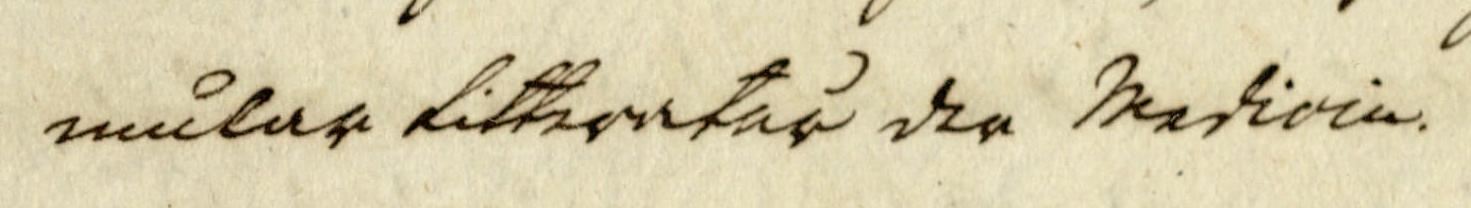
mular Litteratur der Medicin.
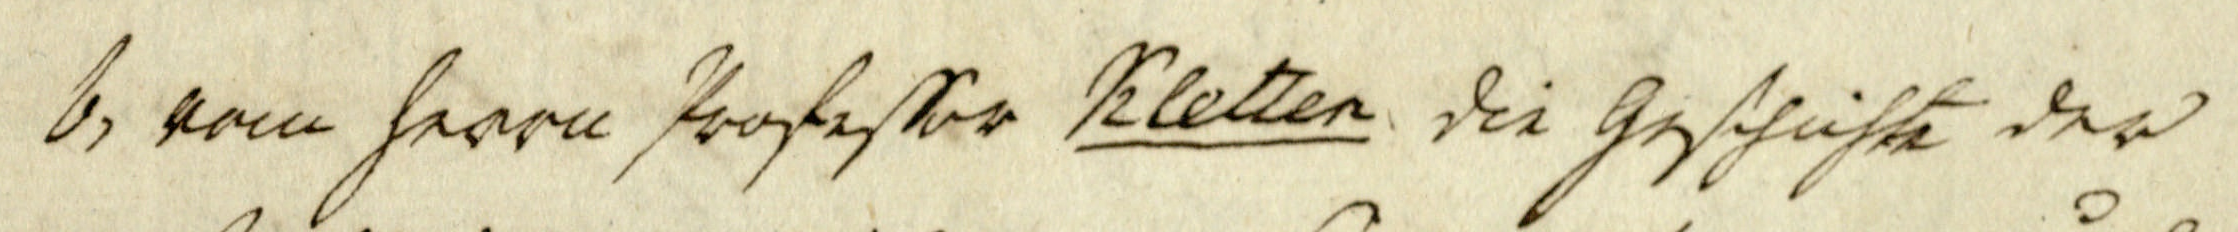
b., vom herrn Professor Kletten die Geschichte der
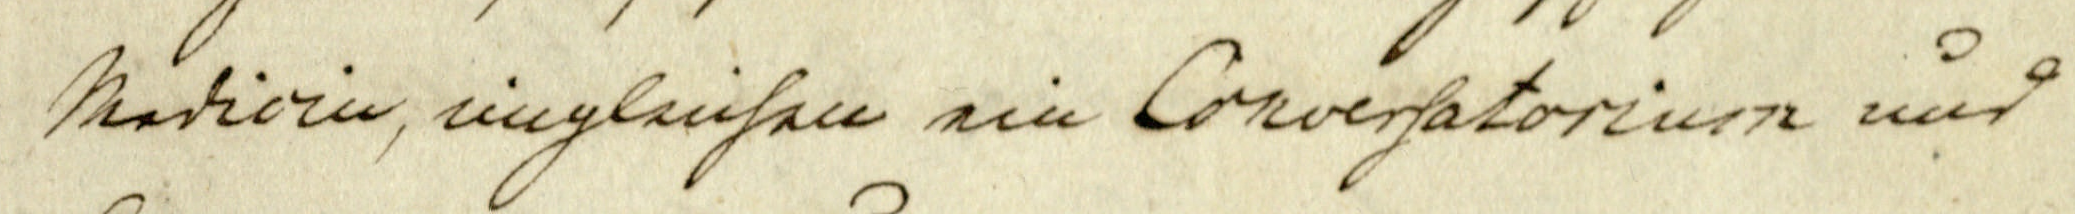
Medicin, ingleichen ein Conversatorium und
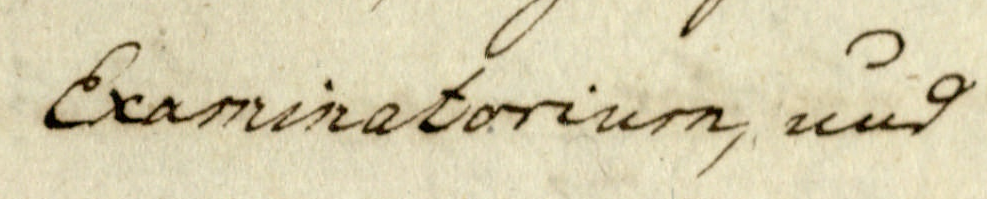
Examinatorium, und
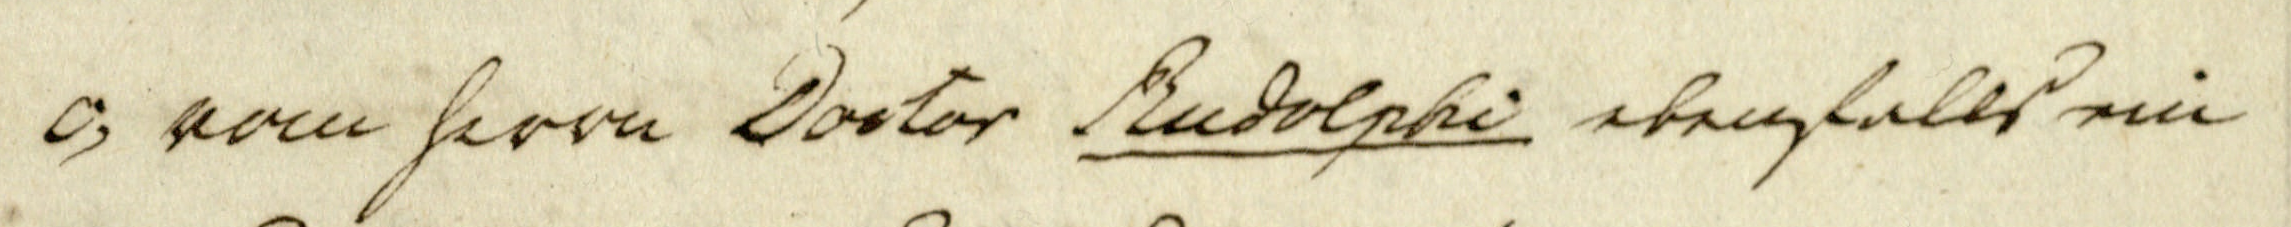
c, vom herrn Doctor Rudolphi ebenfalls ein
